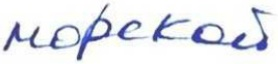морской
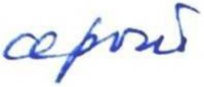серый
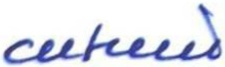синий
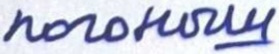погоныш
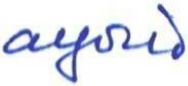ауый
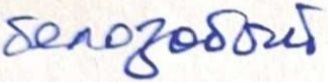белозобый
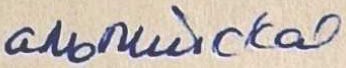альпийская
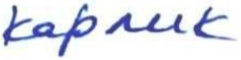карлик
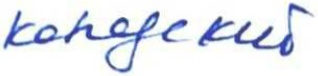конадский
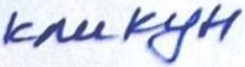кликун
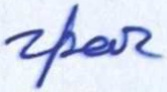грач
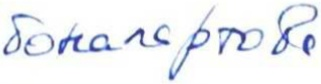бонапартова
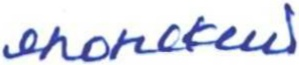японский
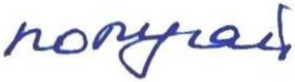попугай
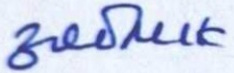зяблик
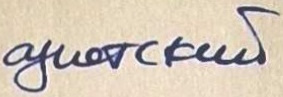азиатский
